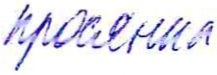просянка
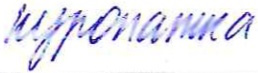куропатка
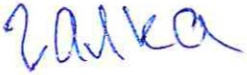галка
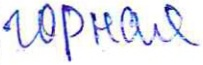горная
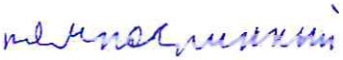темноспинный
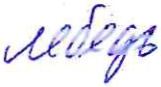лебедь
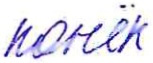конёк
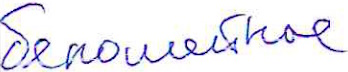белошейная
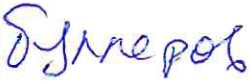буллеров
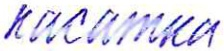касатка
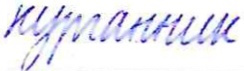курганник
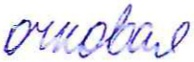очковая
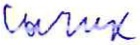сычик
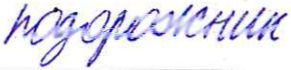подорожник
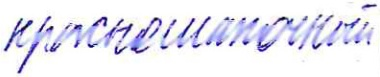красношапочный
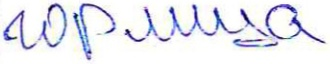горлица
